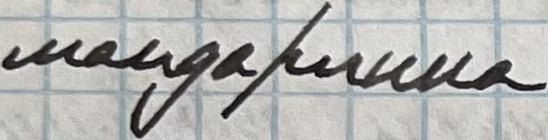мандаринка
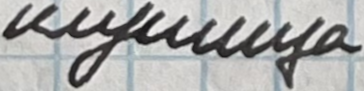клушица
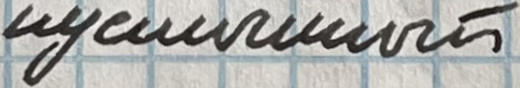пустынный
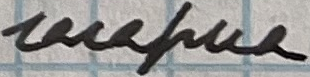гагарка
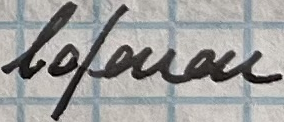воронок
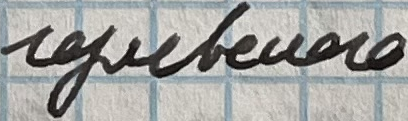годлевского
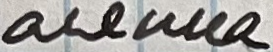оляпка
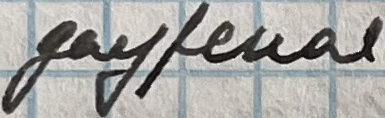даурская
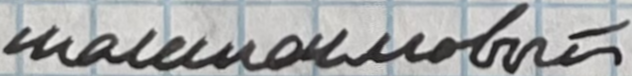толстоклювый
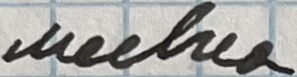моевка
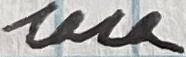гага
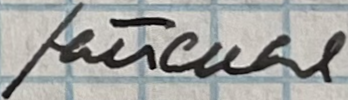райская
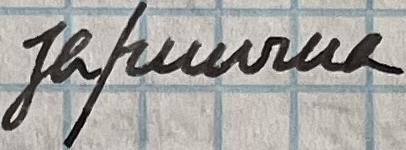зарничка
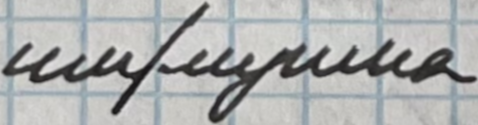тиркушка
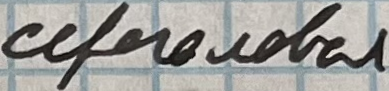сероголовая
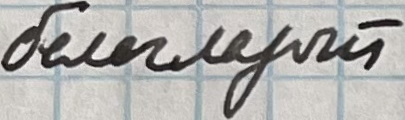белоглазый
